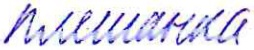плешанка
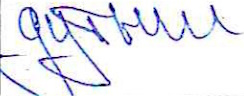дутыш
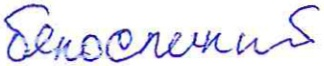белоспиннй
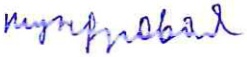тундровая
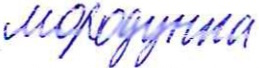мородунка
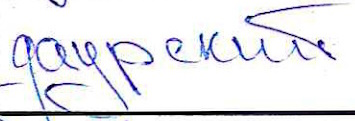даурский
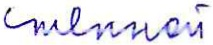степной
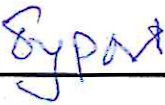бурая
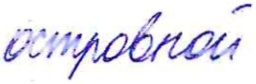островной
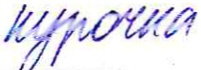курочка
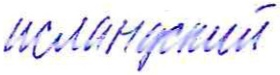исландский
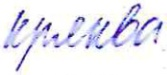кряква
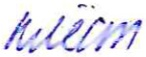клёст
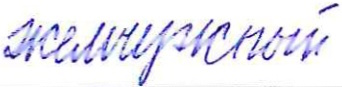жемчужный
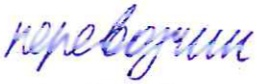перевозчик
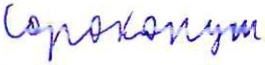сорокопут
